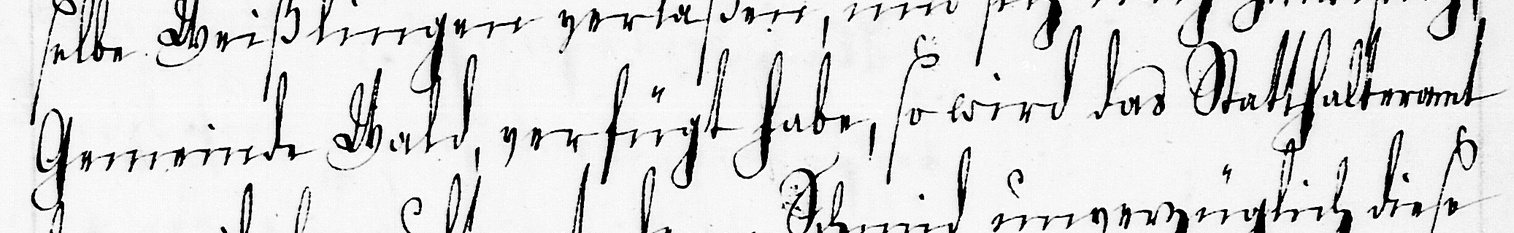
Gemeinde Wald, verfügt habe, so wird das Statthalter¬
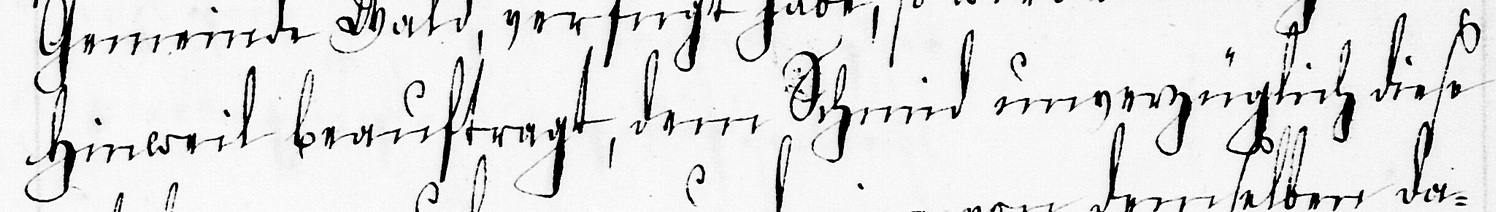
Hinweil beauftragt, dem Schmid unverzüglich diese
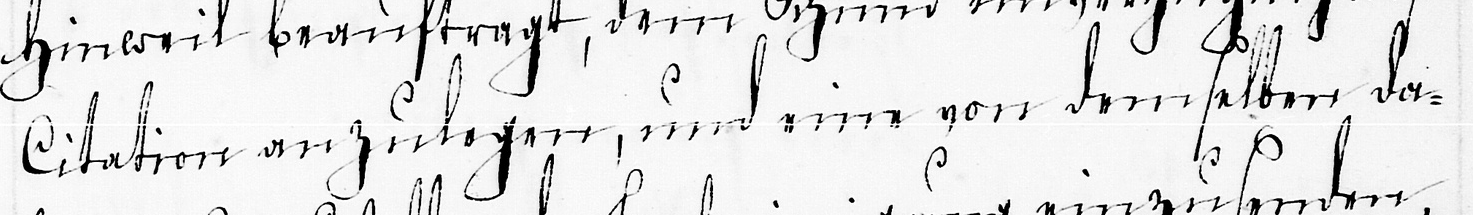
Citation auszulegen, und eine von demselben da¬
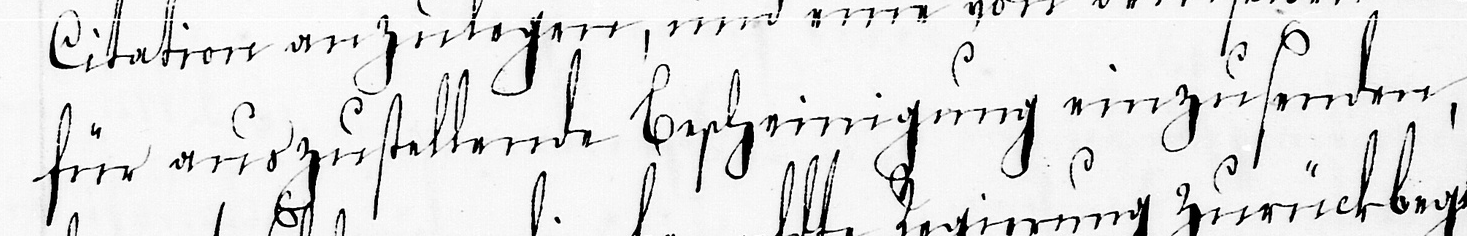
für auszustellende Bescheinigung einzusenden,
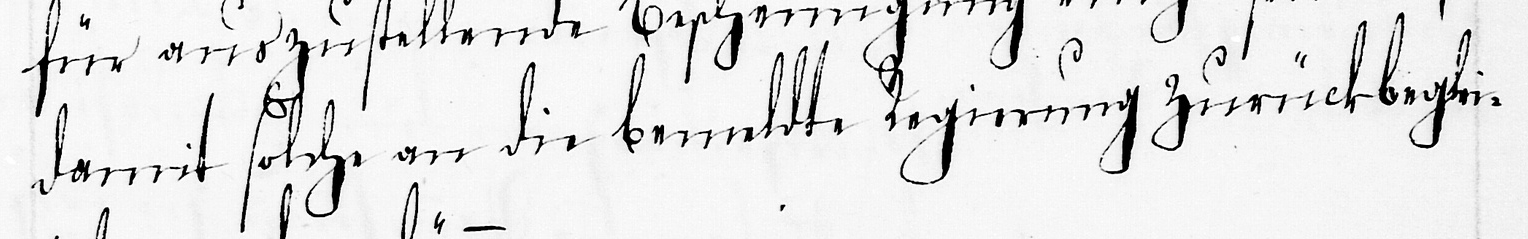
damit solche an die bemeldte Regierung zurückbeglei¬
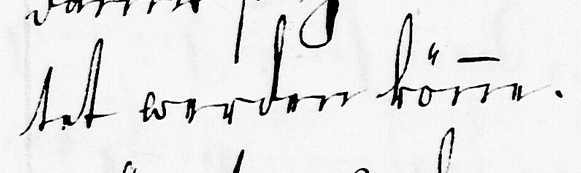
tet werden könne.
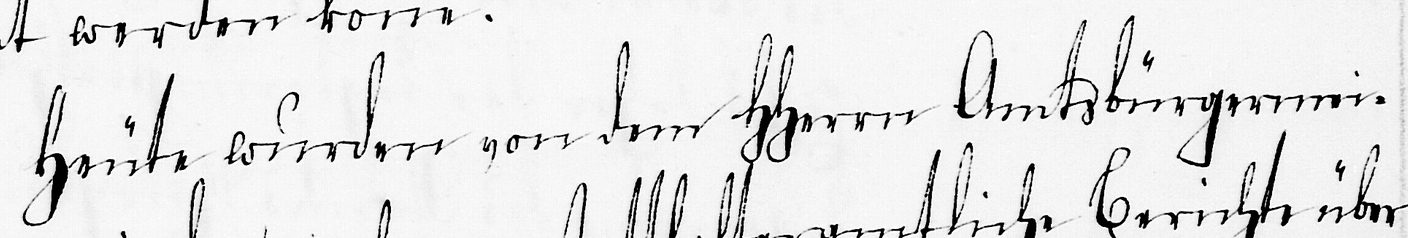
Heute wurden von dem HHerrn Amtsbürgermei¬
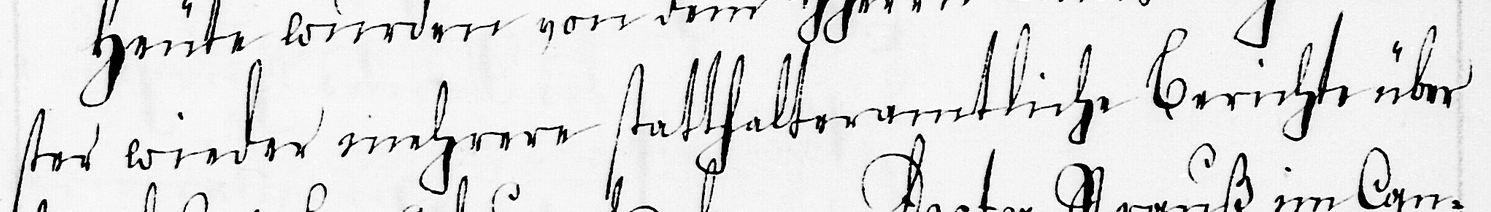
ster wieder mehrere statthalteramtliche Berichte über
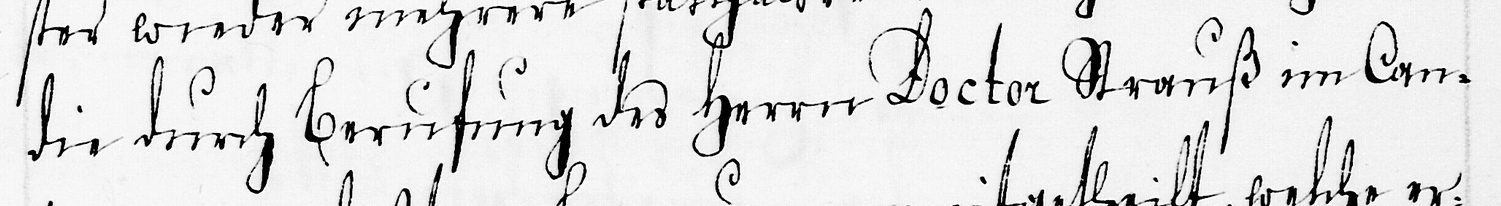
die durch Berufung des Herrn Doctor Strauß im Can¬
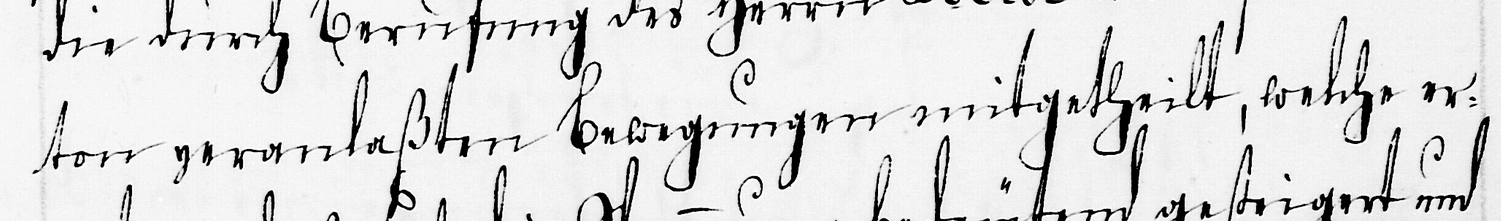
ton veranlaßten Bewegungen mitgetheilt, welche er¬
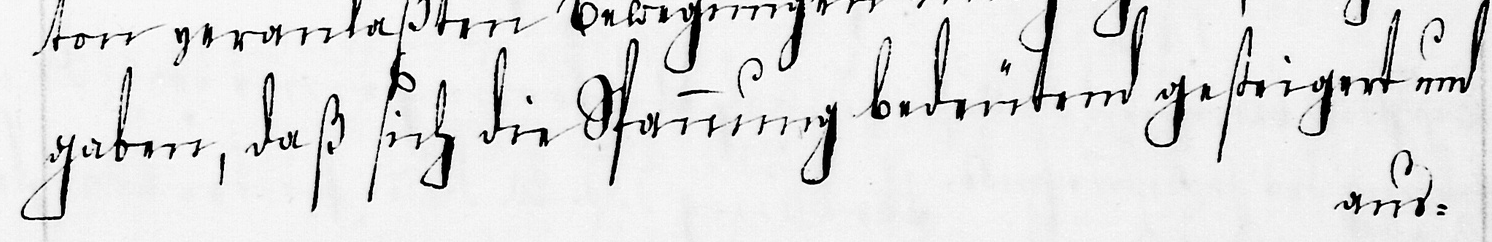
gaben, daß sich die Spannung bedeutend gesteigert und
